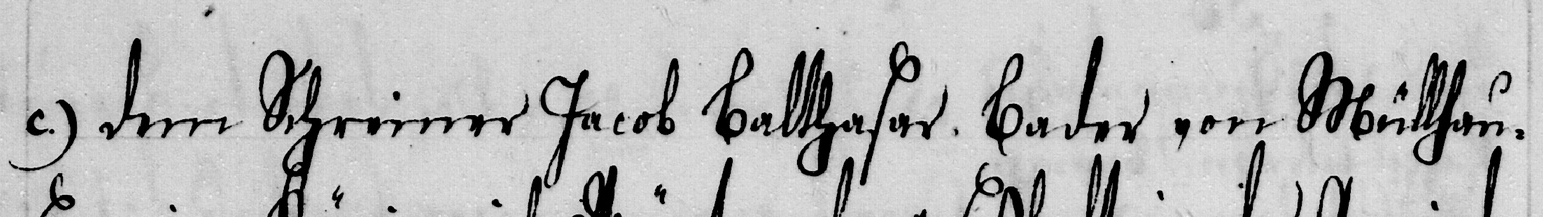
c.) dem Schreiner Jacob Balthasar Bader von Müllhau¬
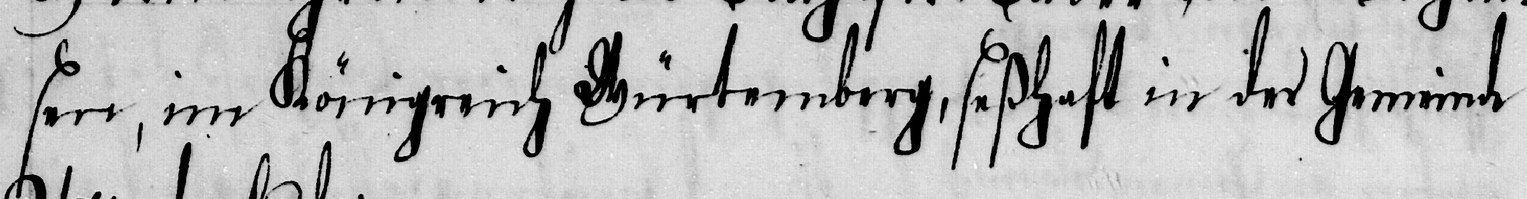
sen, im Königreich Würtemberg, seßhaft in der Gemeinde
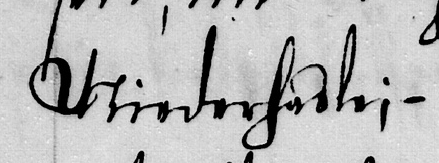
Niederhasli:
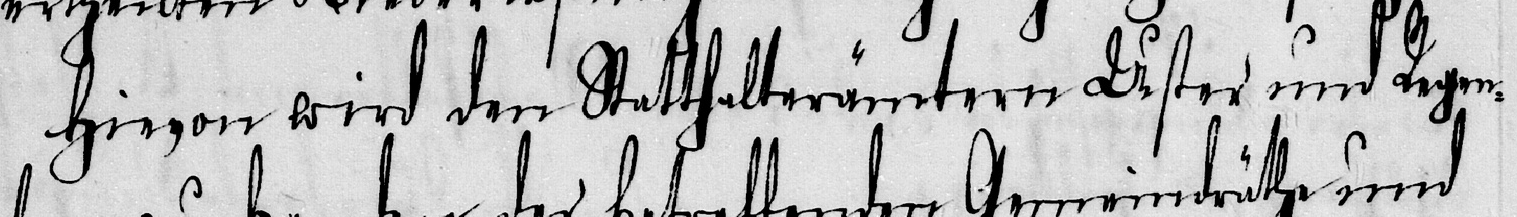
Hievon wird den Statthalterämtern Uster und Regen¬
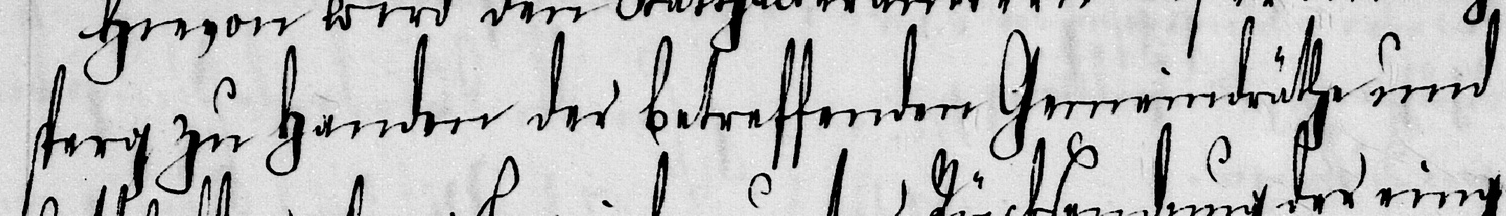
sperg zu Handen der betreffenden Gemeindräthe und
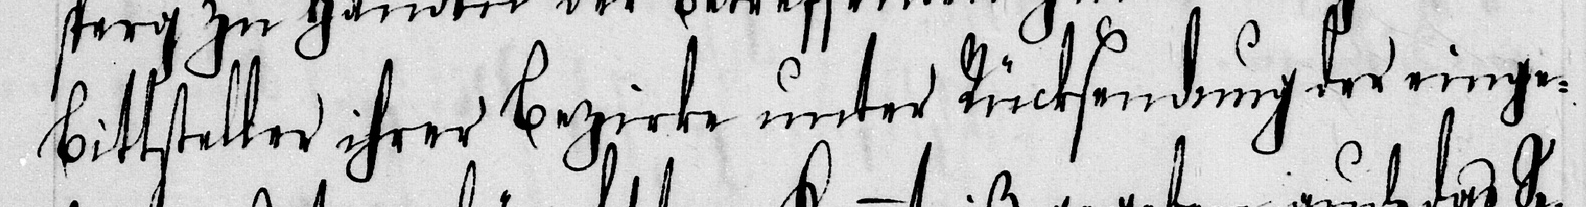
Bittsteller ihrer Bezirke unter Rücksendung der einge¬
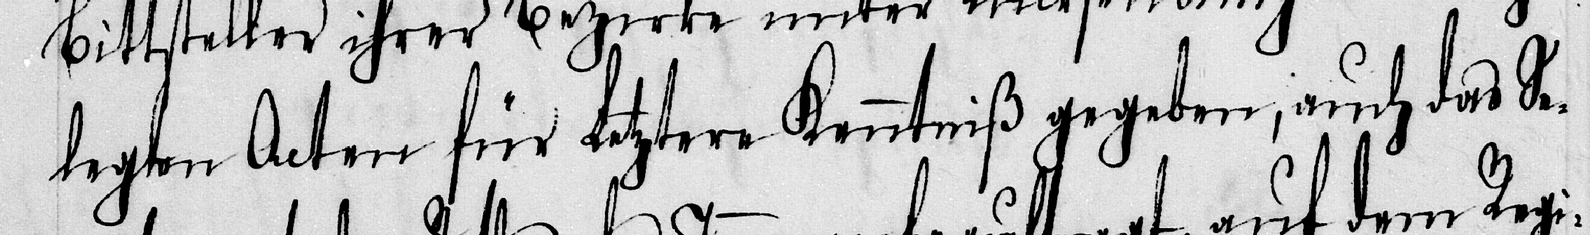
legten Acten für Letztere Kenntniß gegeben, auch das Se¬
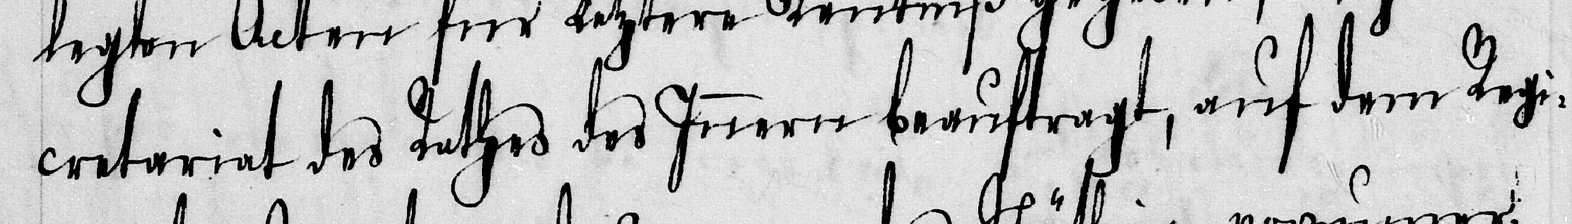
cretariat des Rathes des Innern beauftragt, auf dem Reg¬
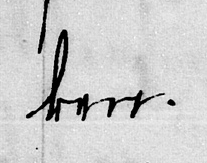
ken.
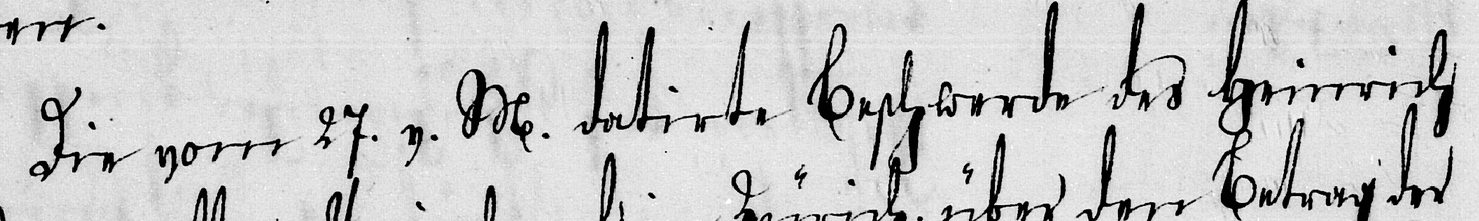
Die vom 27. v. M. datirte Beschwerde des Heinrich
